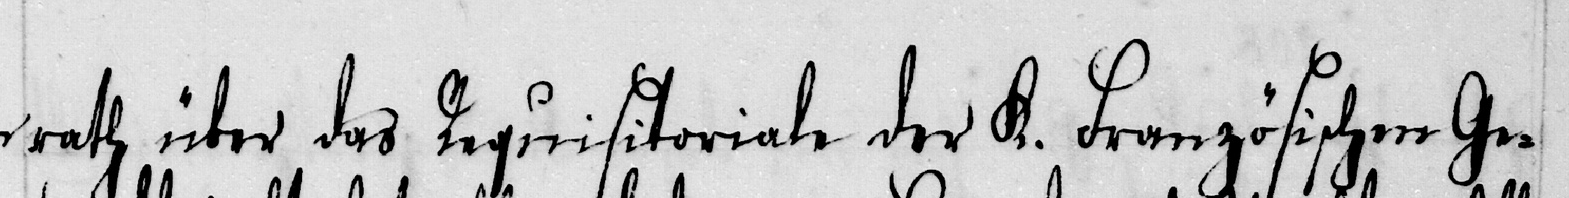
rath über das Requisitoriale der K. Französischen Ge¬
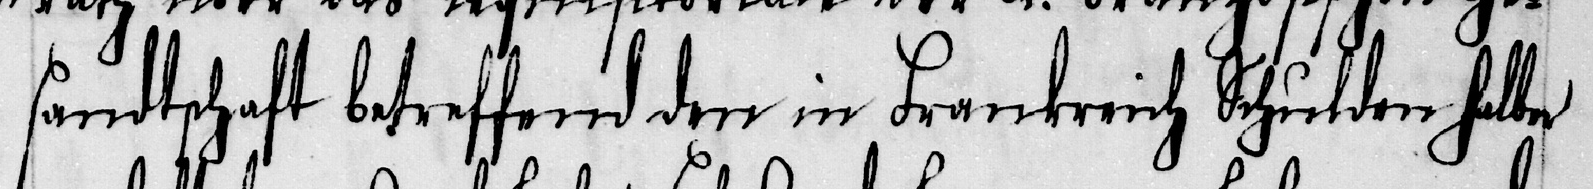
sandtschaft betreffend den in Frankreich Schulden halber
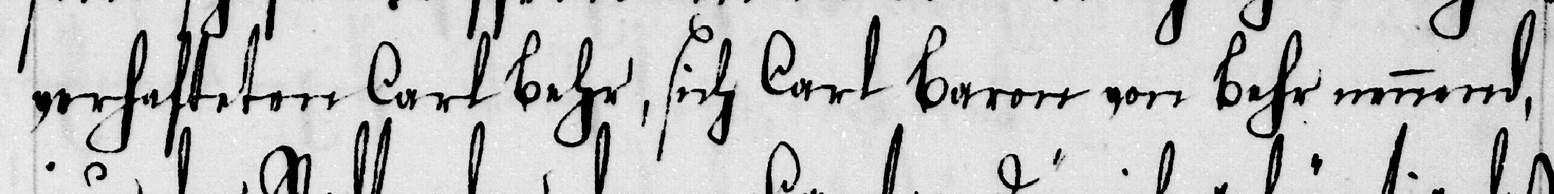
verhafteten Carl Behr, sich Carl Baron von Behr nennend,
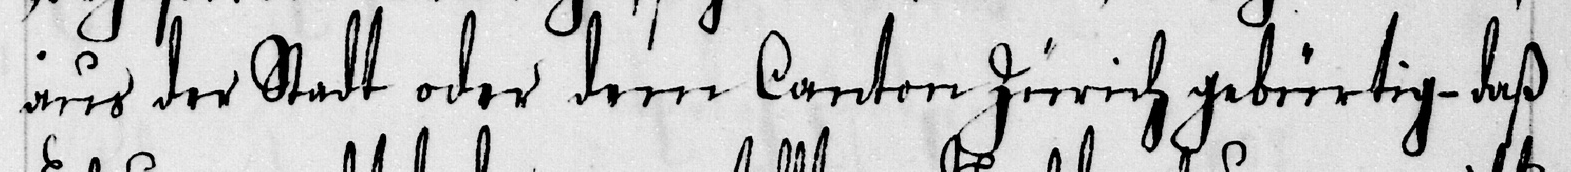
aus der Stadt oder dem Canton Zürich gebürtig – daß
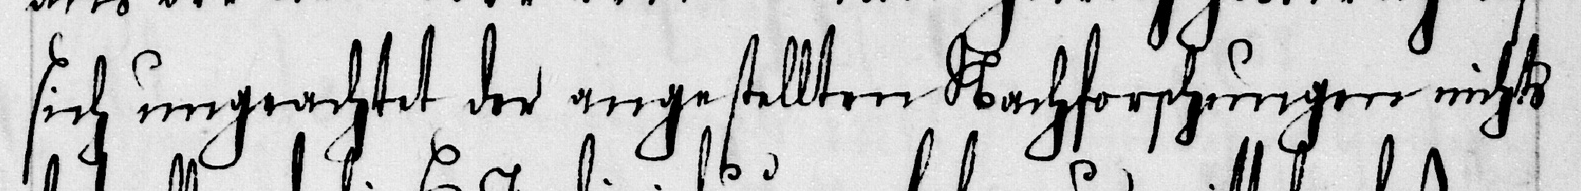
sich ungeachtet der angestellten Nachforschungen nichts
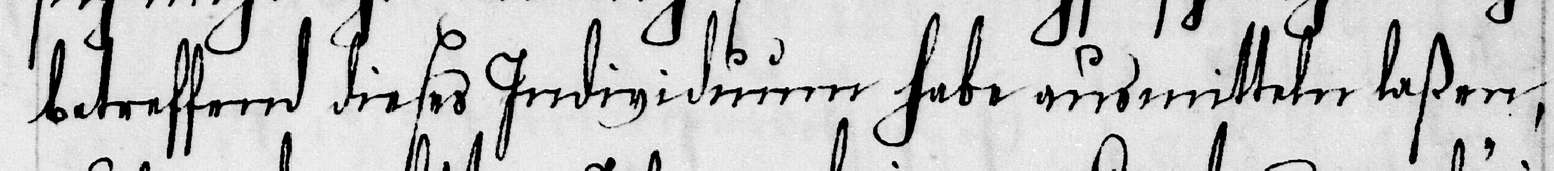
betreffend dieses Individuum habe ausmitteln laßen,
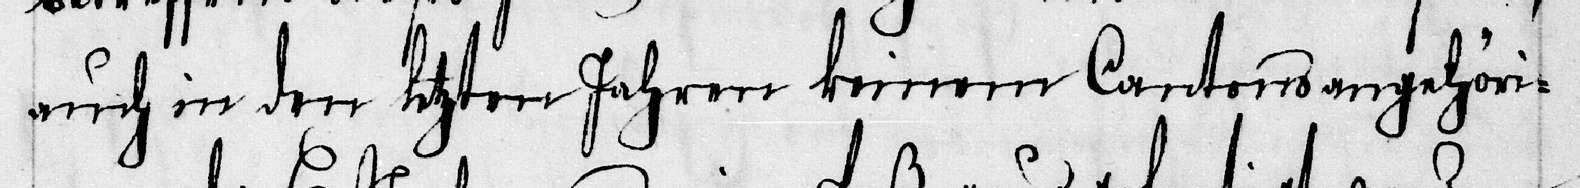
auch in den letzten Jahren keinem Cantonsangehöri¬
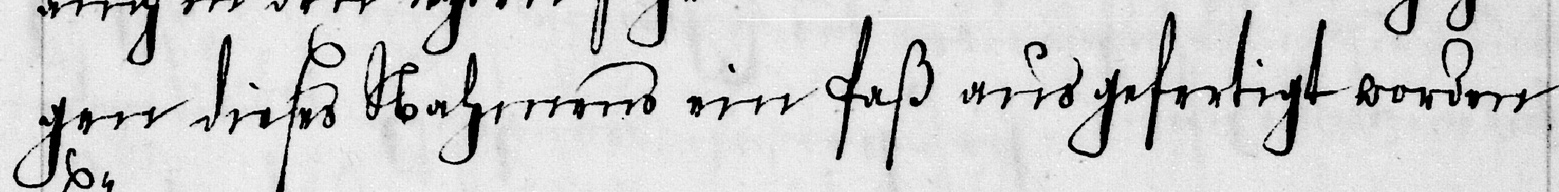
gen dieses Nahmens ein Paß ausgefertigt worden
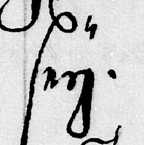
sey.
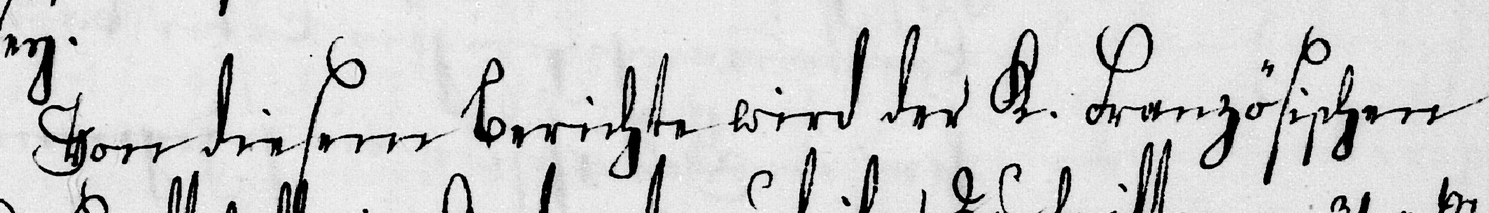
Von diesem Berichte wird der K. Französischen
